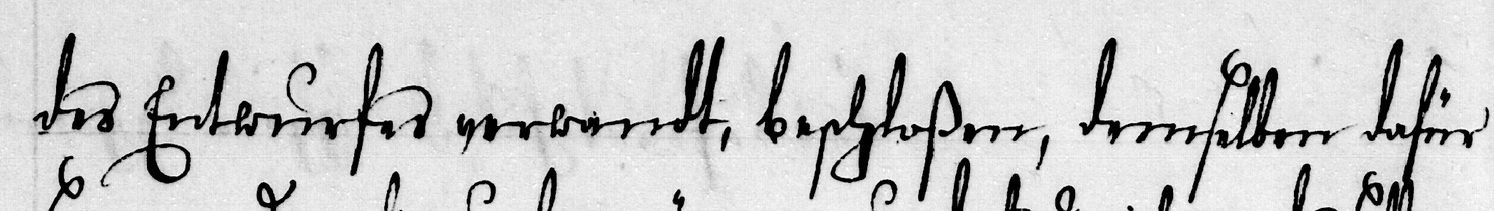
des Entwurfes verwandt, beschloßen, demselben dafür
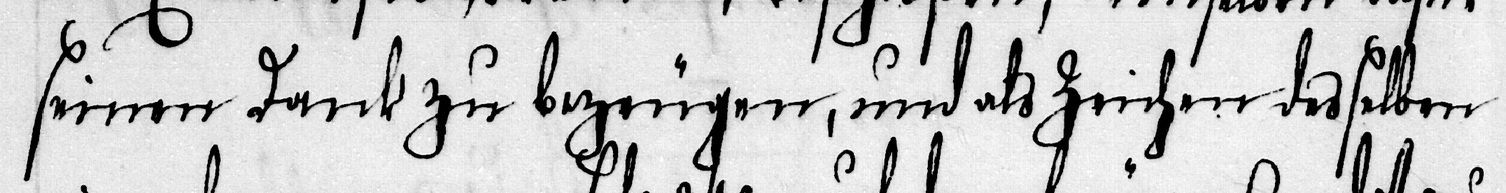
seinen Dank zu bezeugen, und als Zeichen desselben
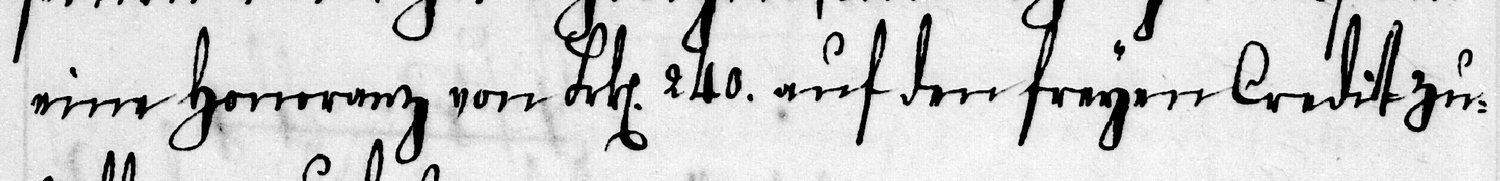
eine Honoranz von Frk[en]. 240. auf den freyen Credit zu¬
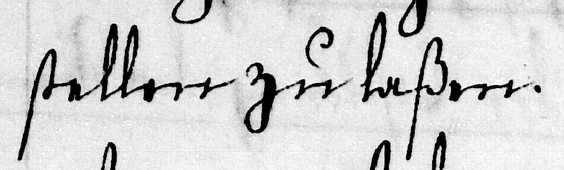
stellen zu laßen.
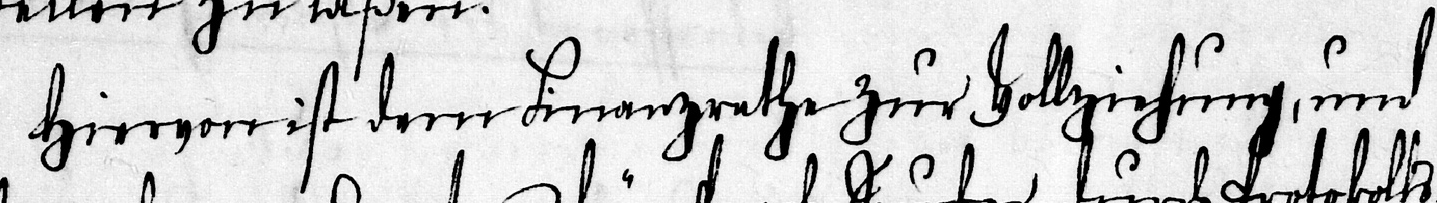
Hiervon ist dem Finanzrathe zur Vollziehung, und
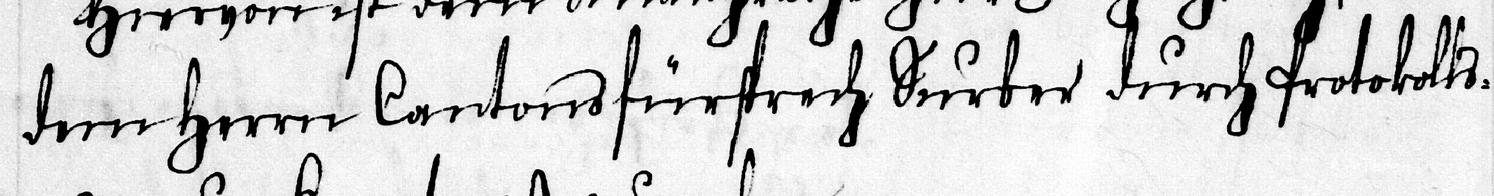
dem Herrn Cantonsfürsprech Surber durch Protokoll¬
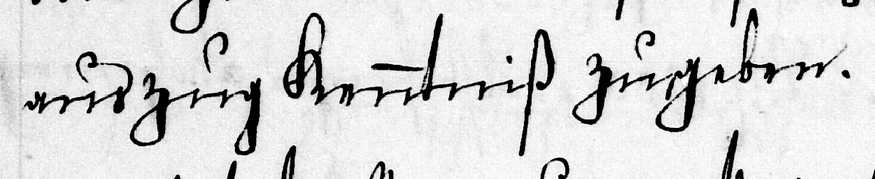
sauszug Kenntniß zu geben.
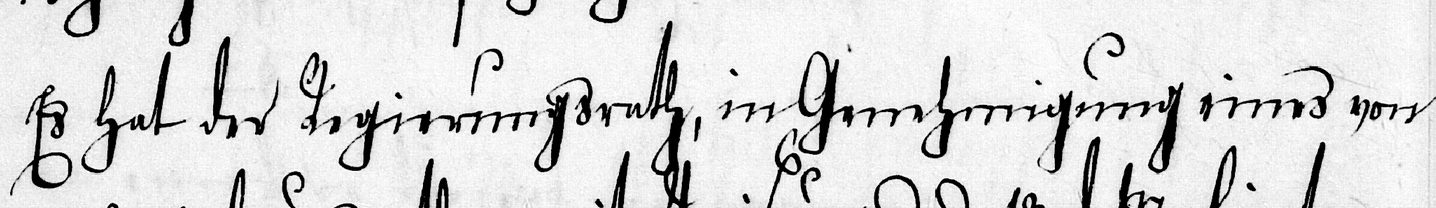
Es hat der Regierungsrath, in Genehmigung eines von
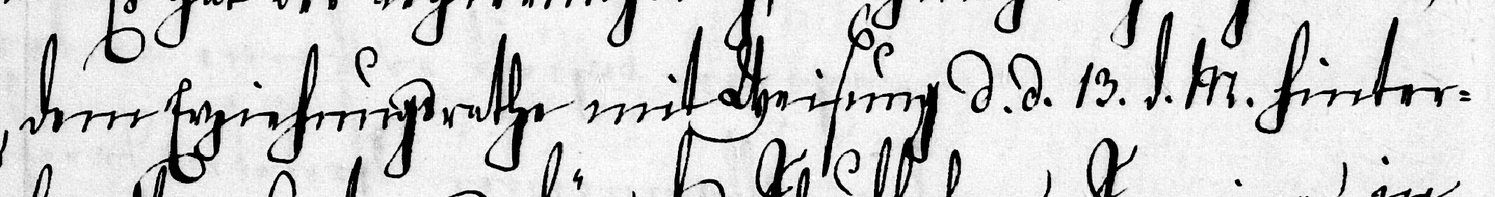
dem Erziehungsrathe mit Weisung d. d. 13. d. M. hinter¬
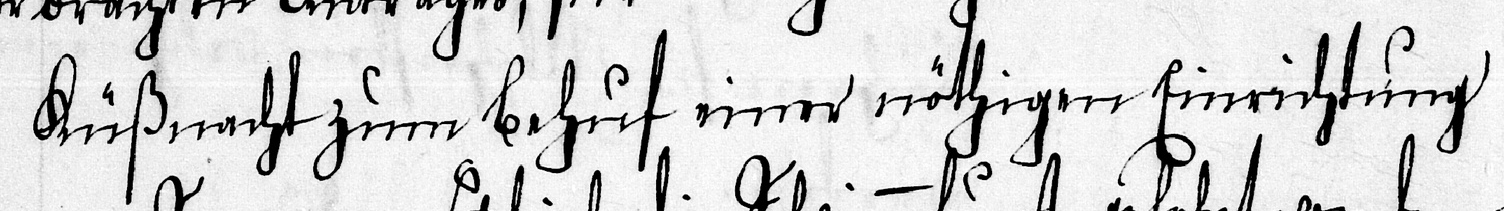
Küßnacht zum Behuf einer nöthigen Einrichtung
